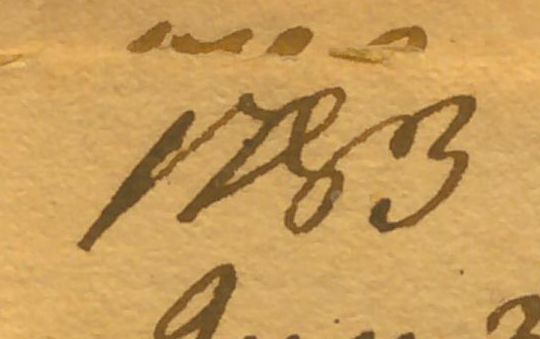1783
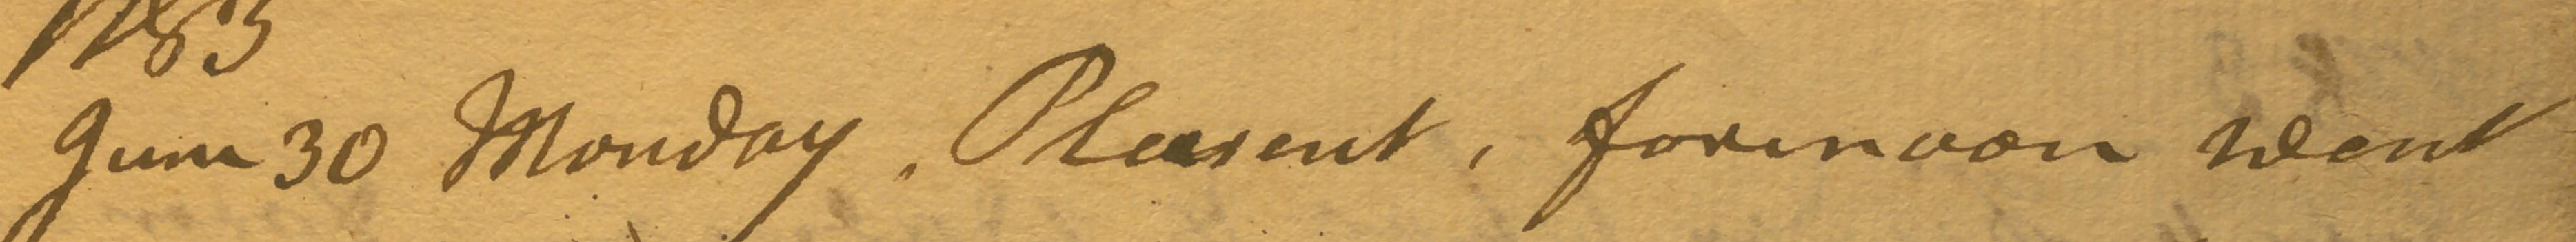June 30 Monday, Pleasent, forenoon went
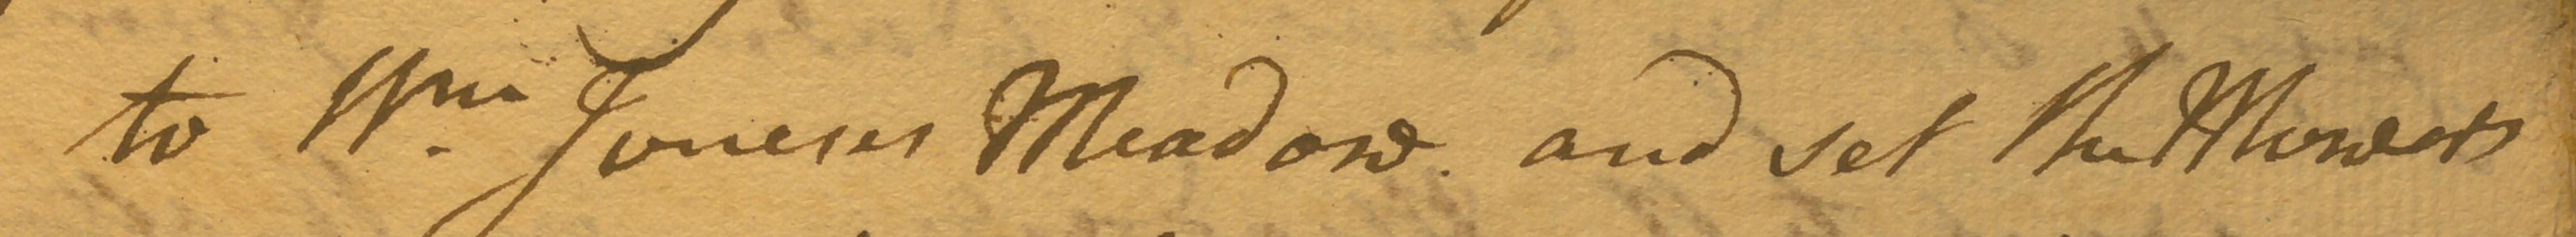to W^m. Joneses Meadow, and set the Mowers
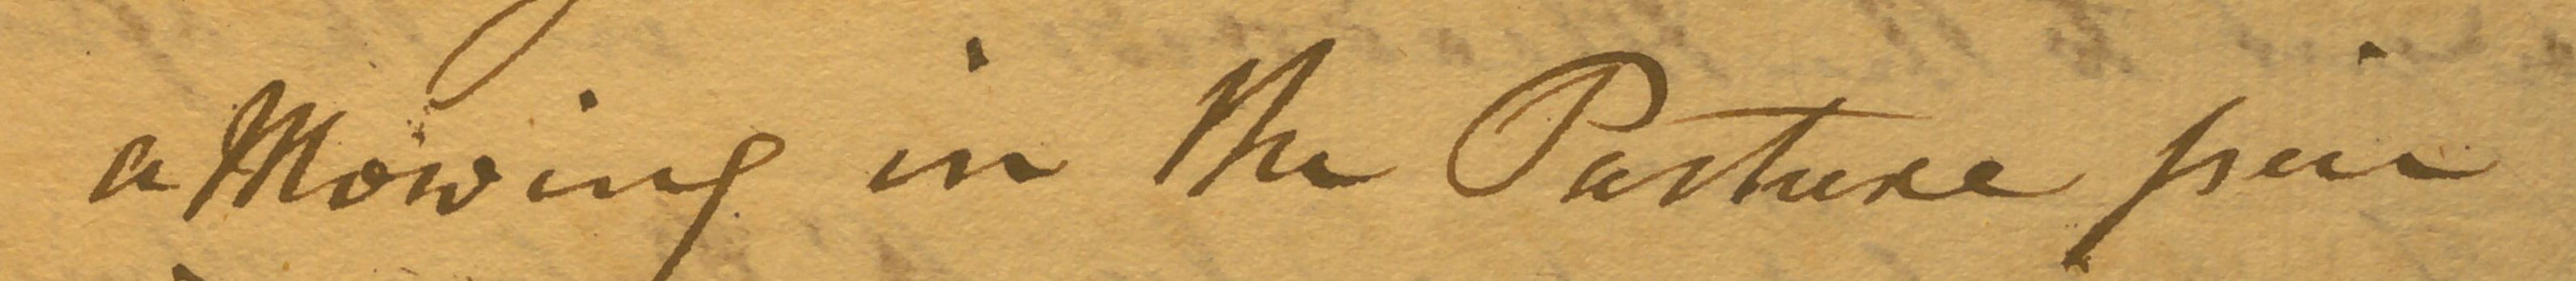a Mowing in the Pasture pice
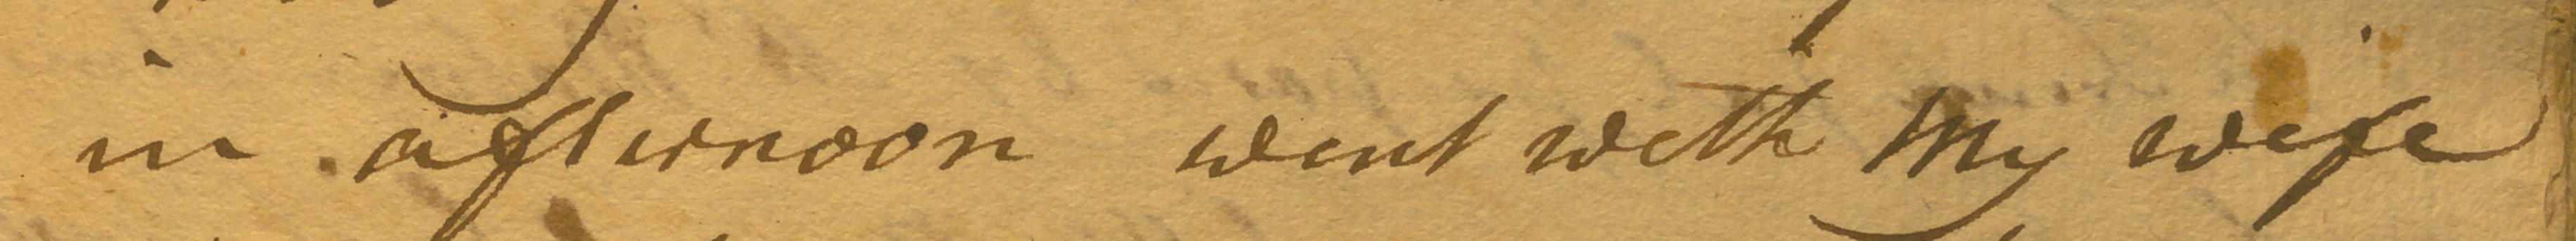in afternoon went with My wife
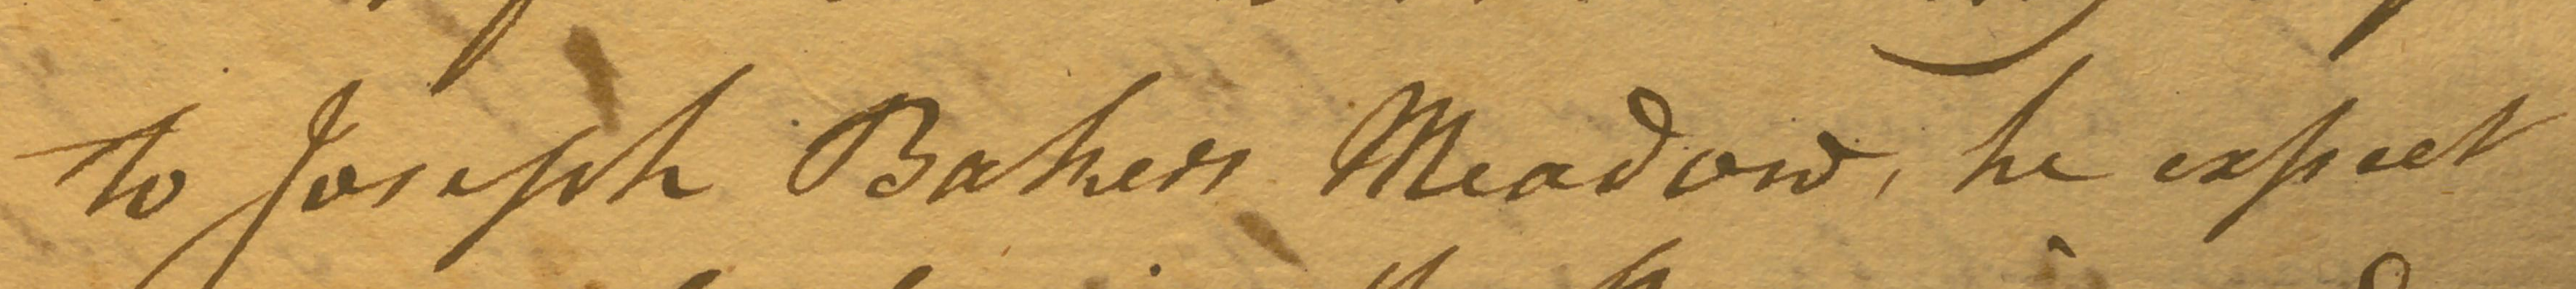to Joseph Bakers Meadow, he expect
